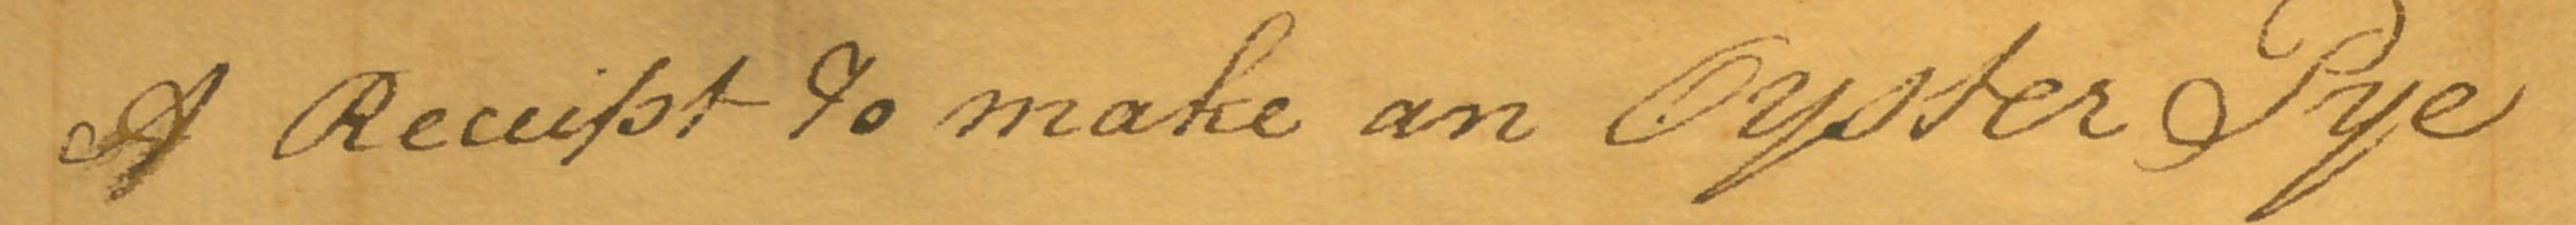A Receipt to make an Oyster Pye
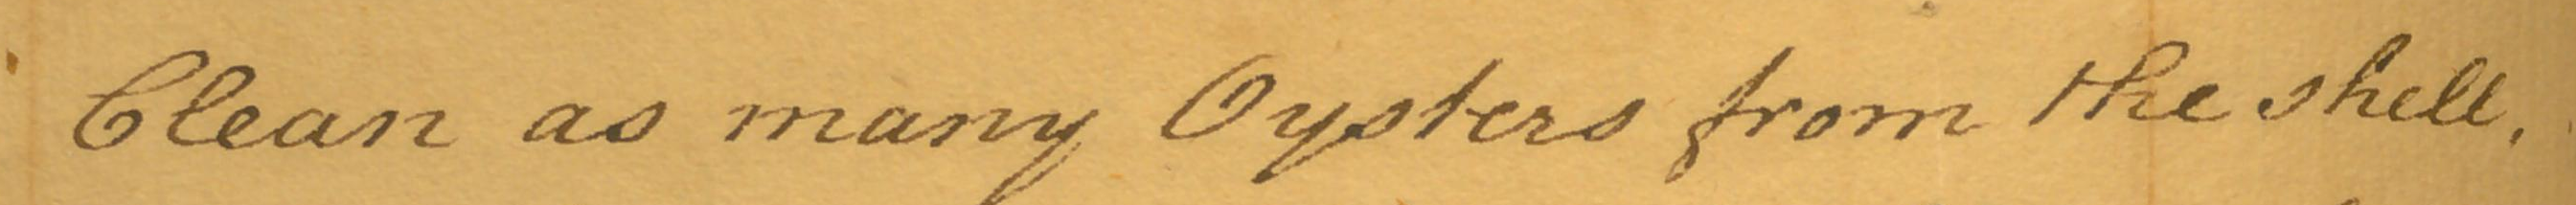Clean as many Oysters from the shell,
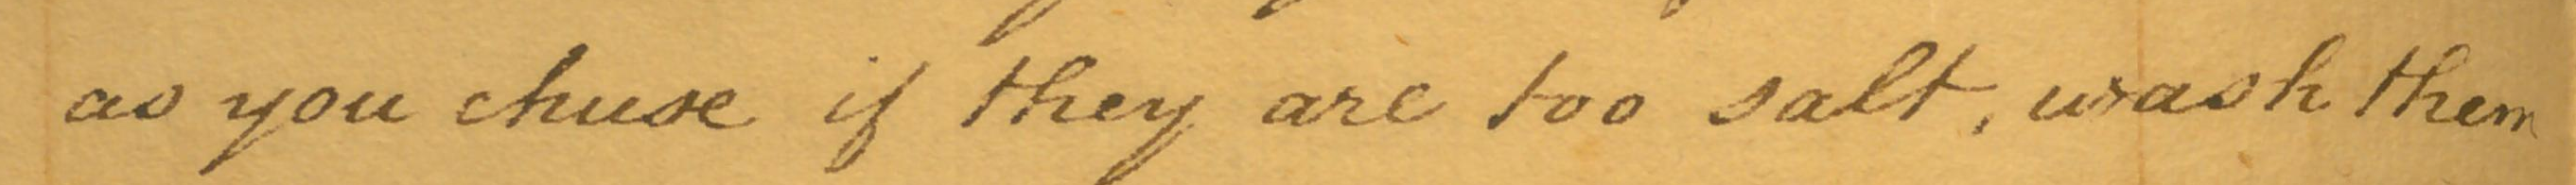as you chuse if they are too salt, wash them
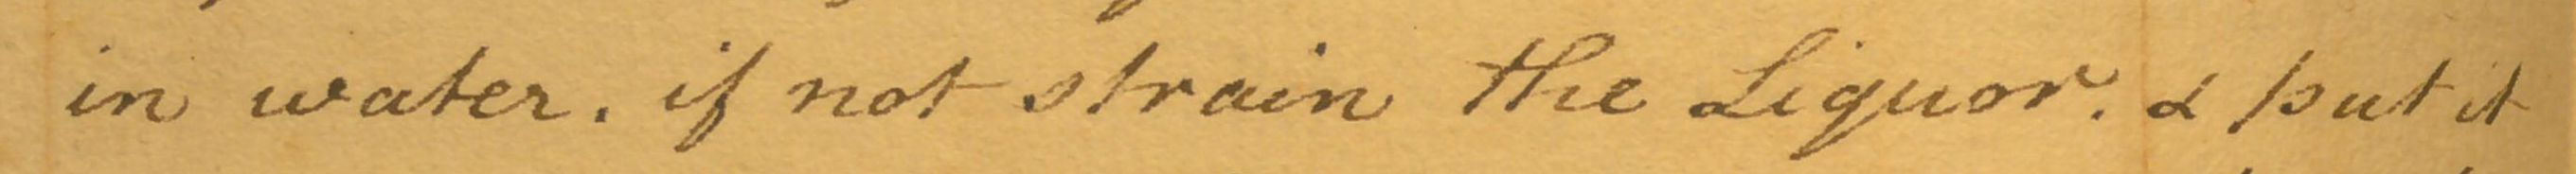in water, if not strain the Liquor. & put it
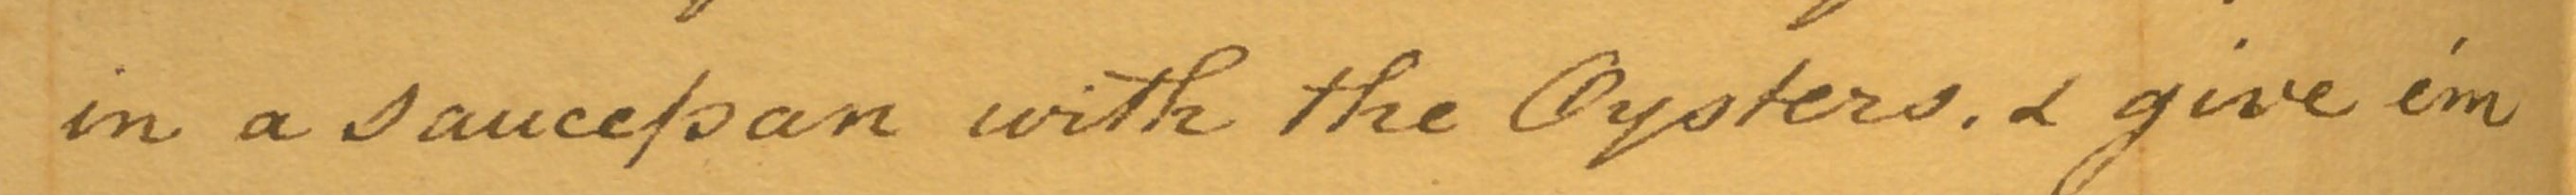in a saucepan with the Oysters, & give 'em
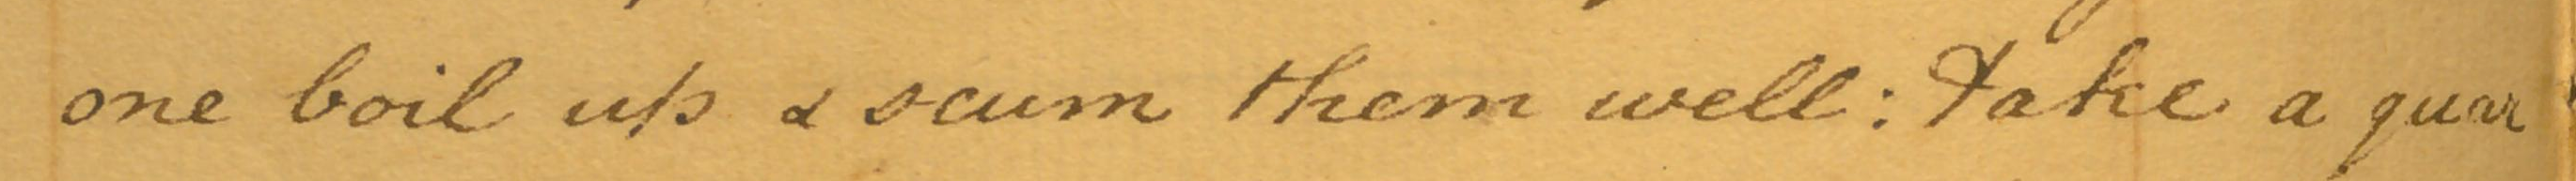one boil up & scum them well: take a quar
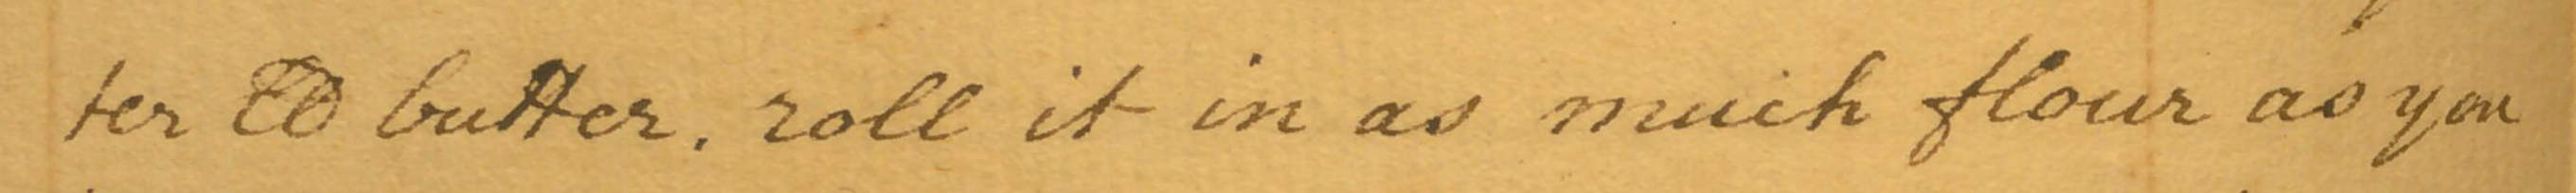ter lb butter, roll it in as much flour as you
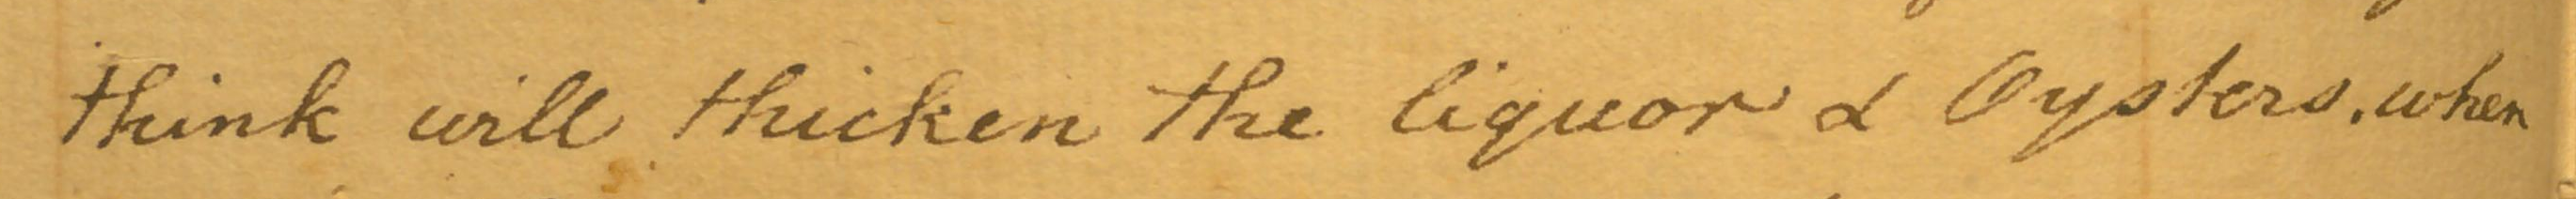think will thicken the liquor & Oysters, when
